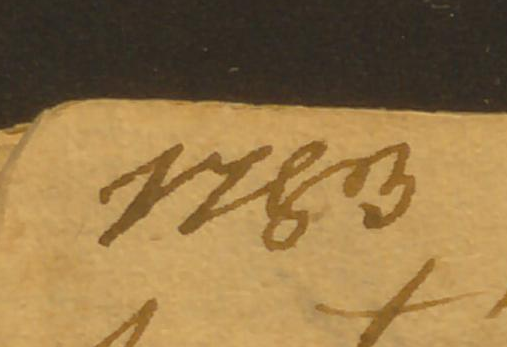1783
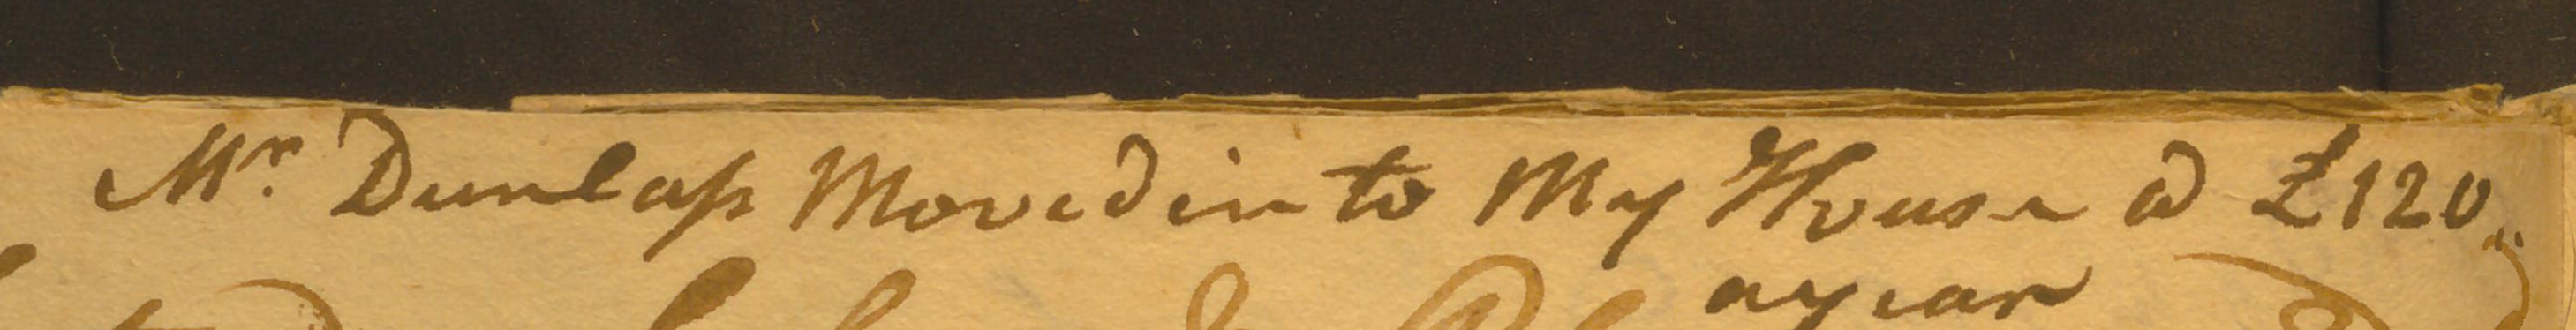M^r. Dunlap Moved in to My House @ £120
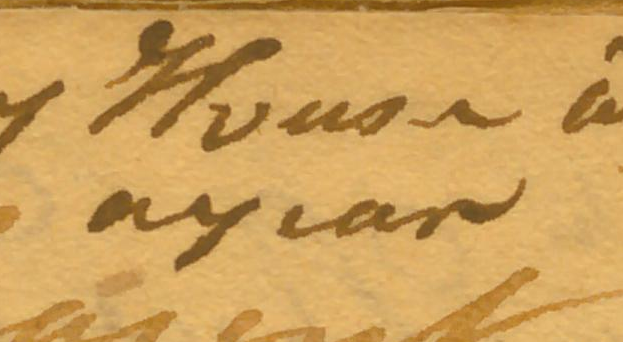a year
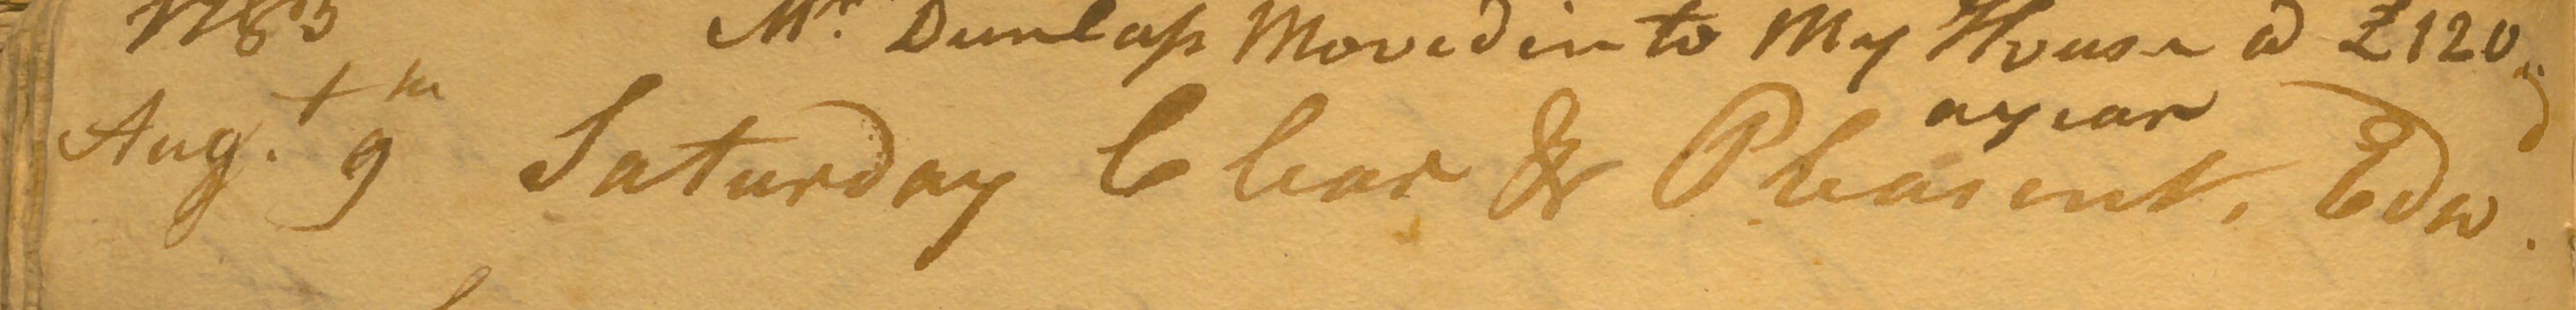Aug^t. 9^th Saturday Clear & Pleasent. Edw^d
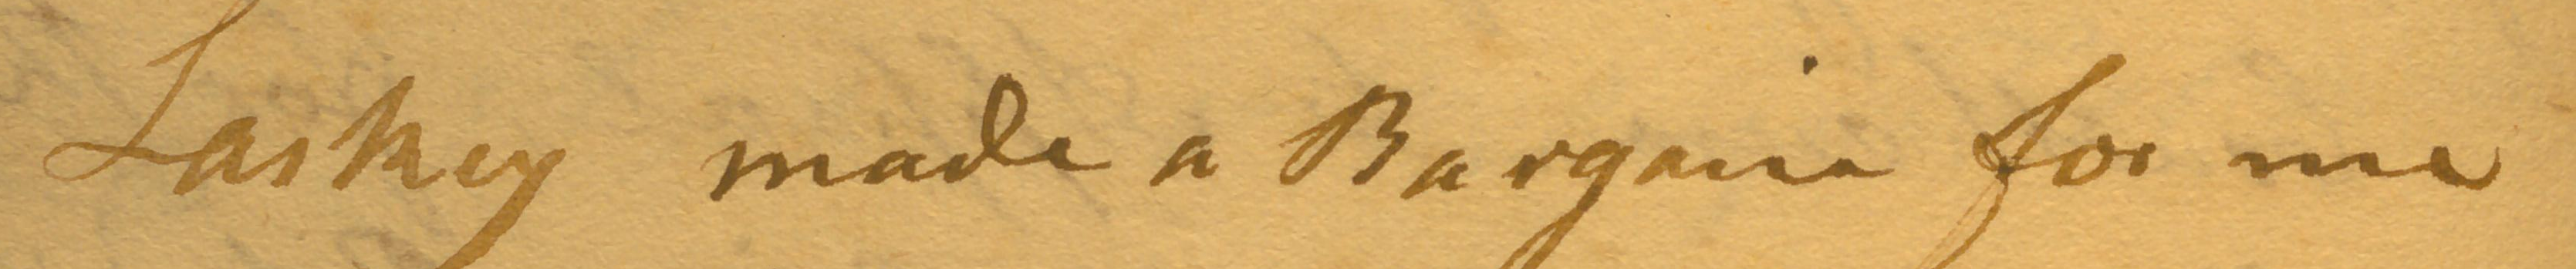Laskey made a Bargain for me
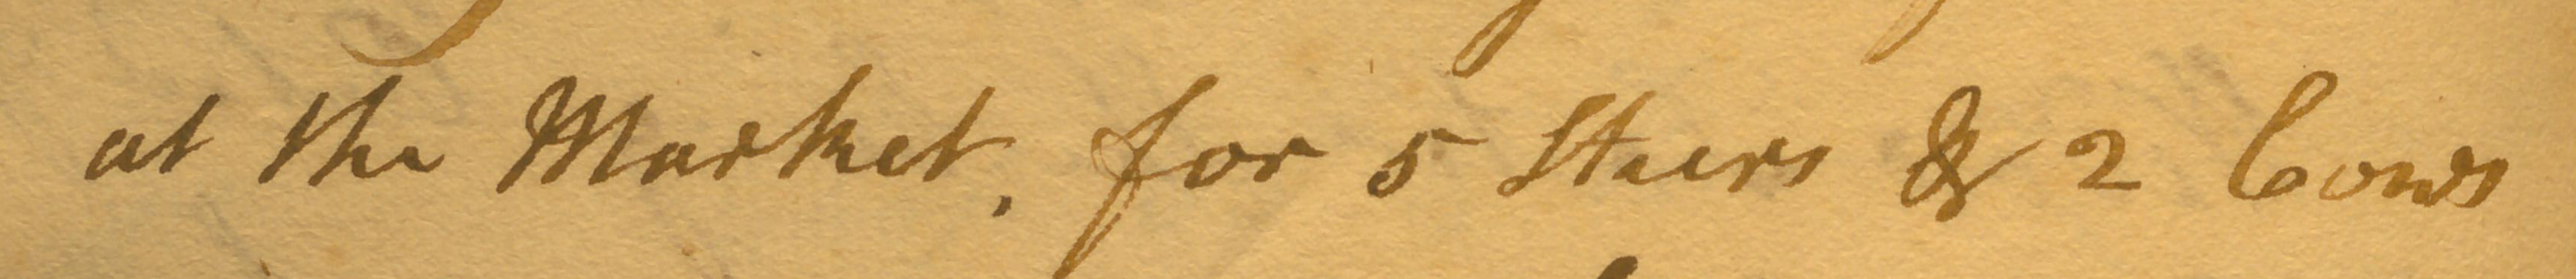at the Market for 5 steers & 2 Cows
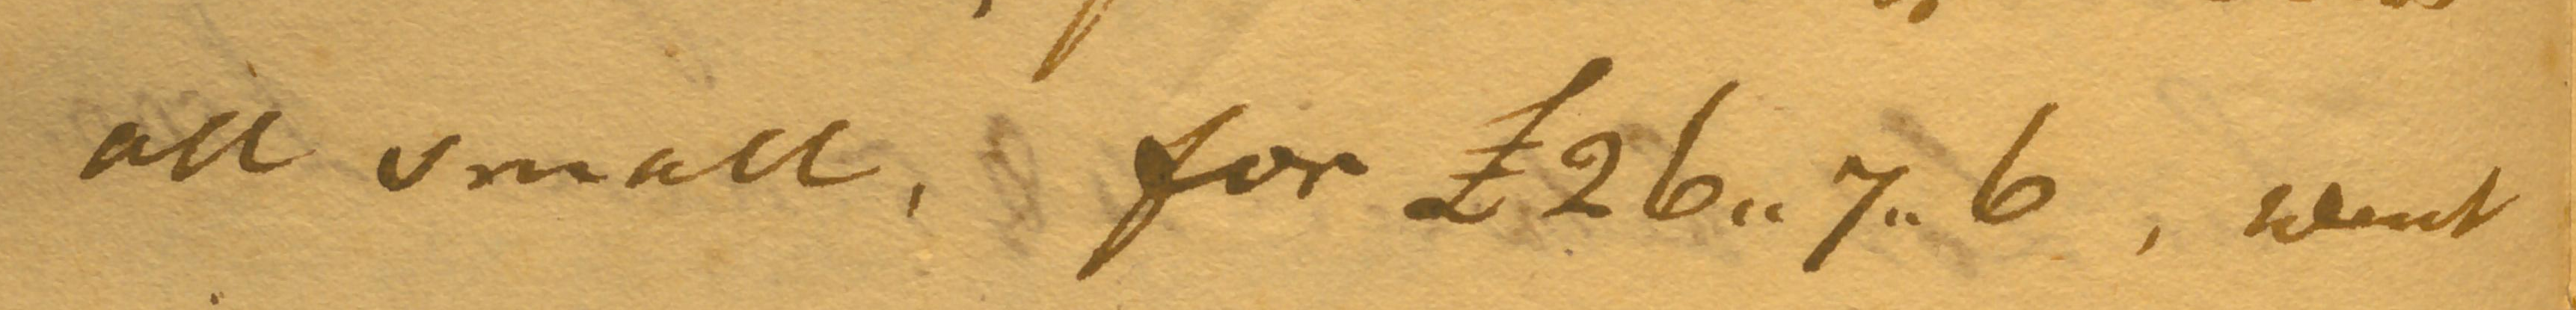all small, for £26.7.6, went
